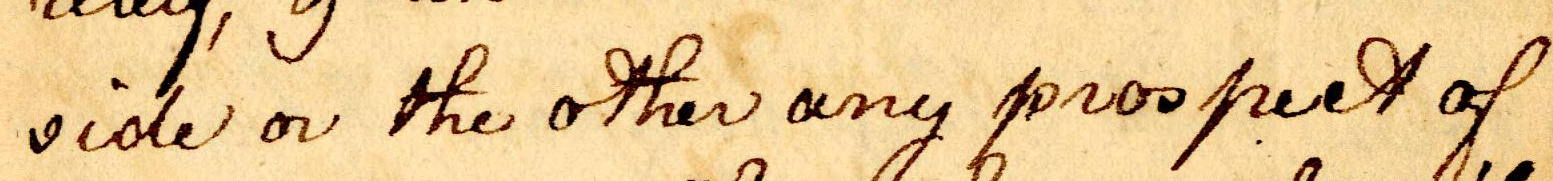side or the other any prospect of
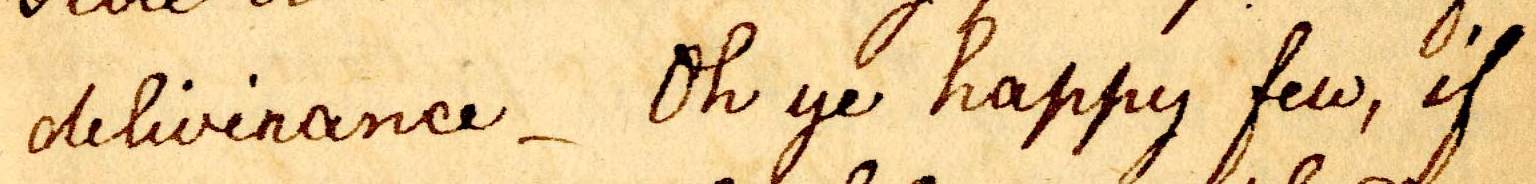delivirance- Oh ye happy few, if
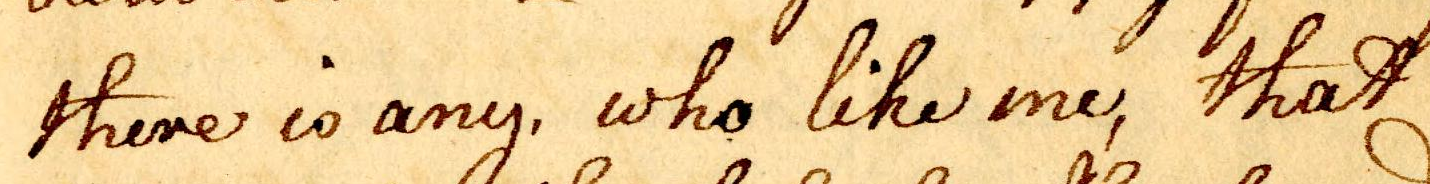there is any who like me, that
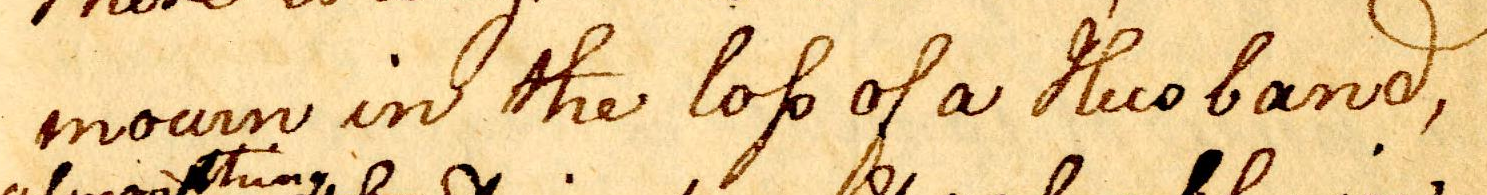mourn in the loss of a Husband,
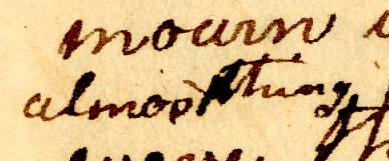almost thing
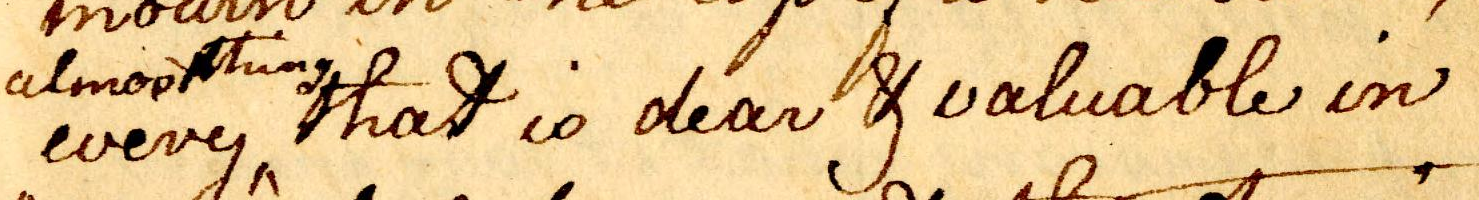every ^ that is dear & valuable in
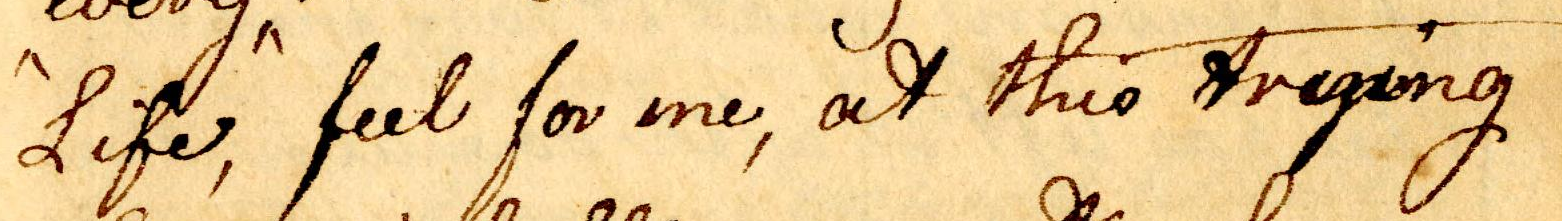Life, feel for me at this trying
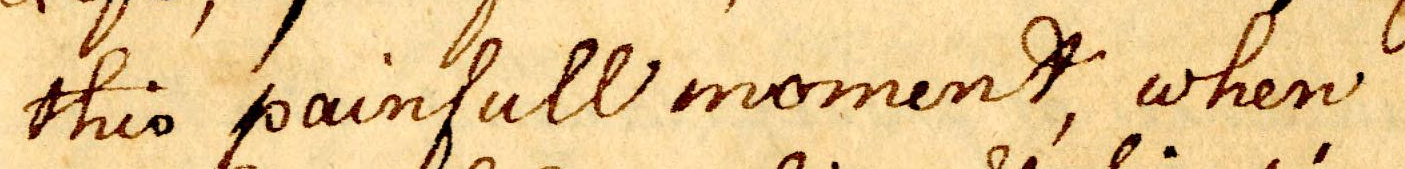this painfull moment when
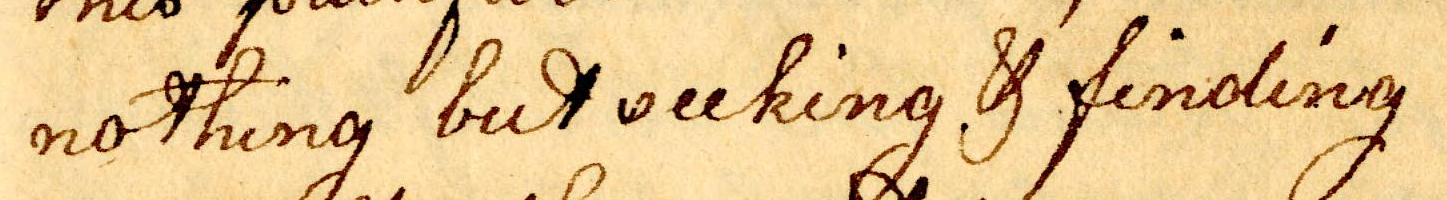nothing but seeking & finding
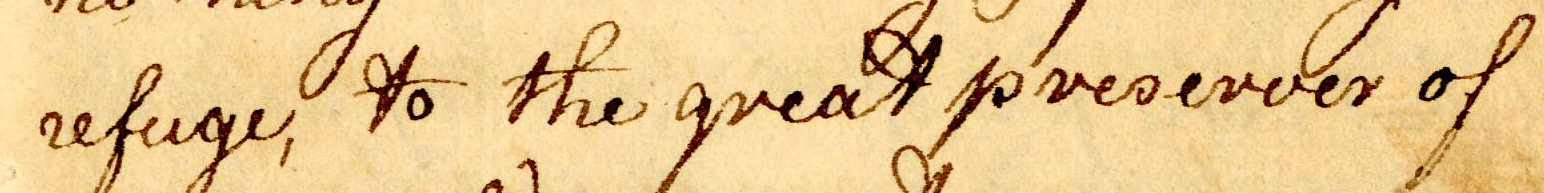refuge, to the great preserver of
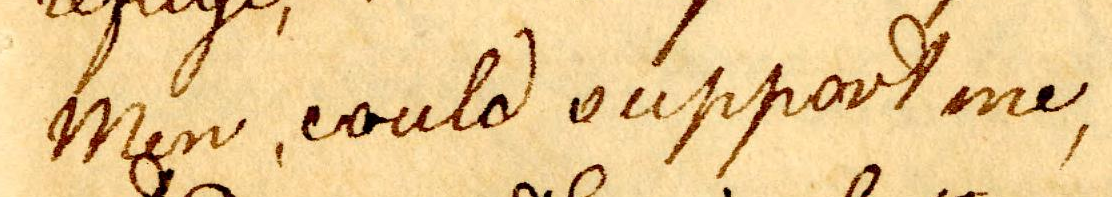Men, could support me,
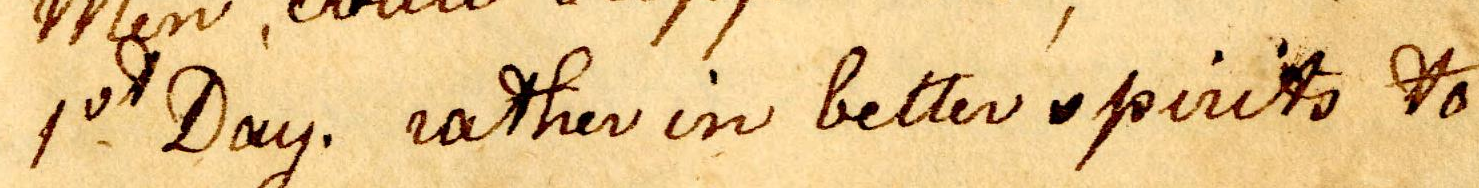1^st Day, rather in better spirits to
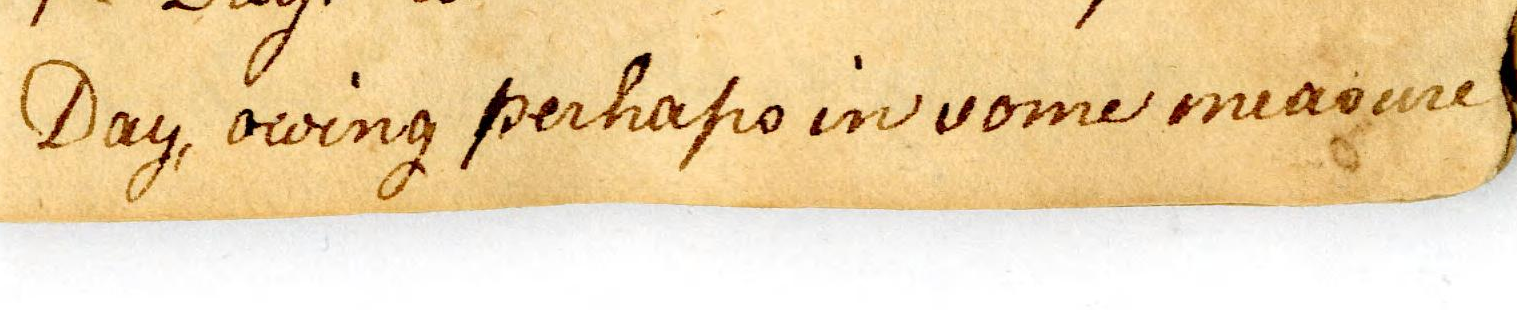Day, owing perhaps in some measure
